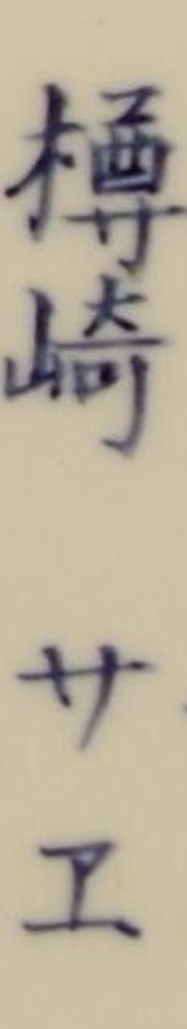梅崎サヱ
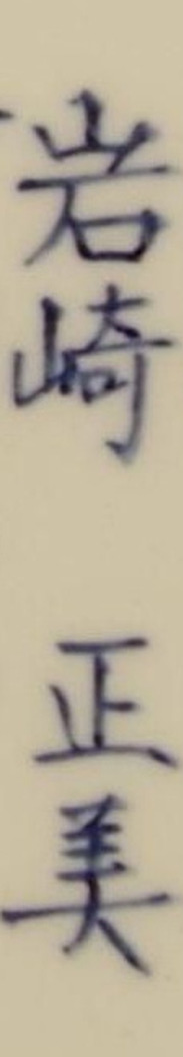岩崎正美
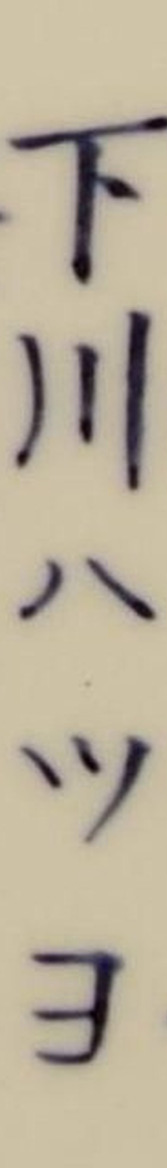下川ハツヨ
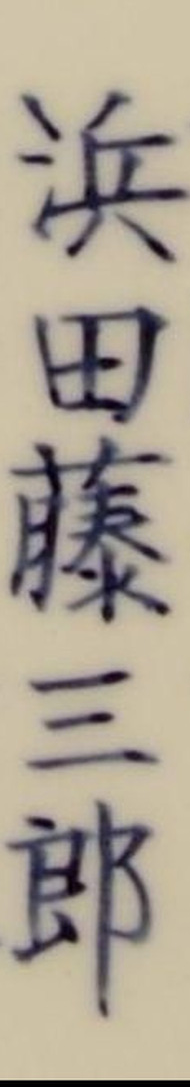浜田藤三郎
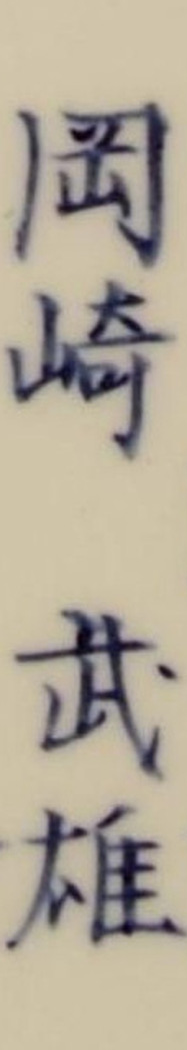岡崎武雄
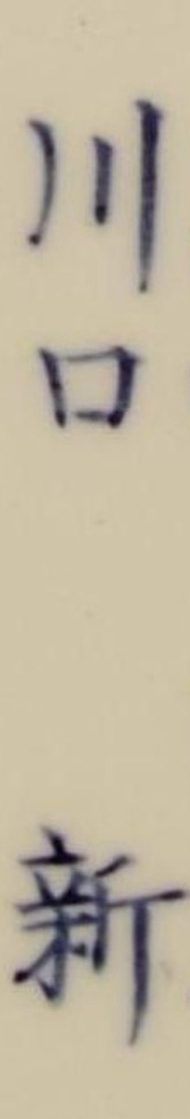川口新
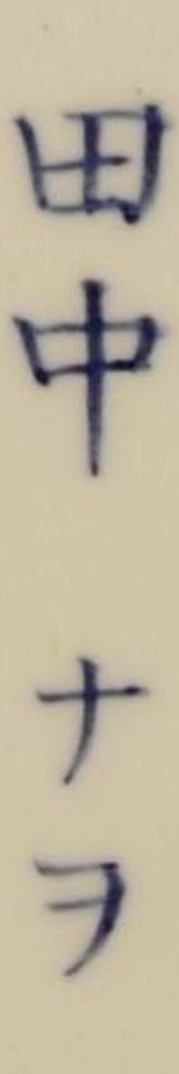田中ナヲ
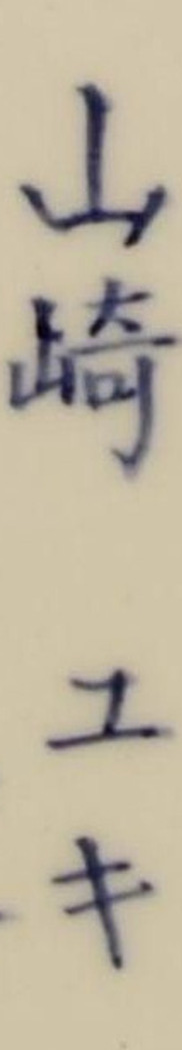山崎ユキ
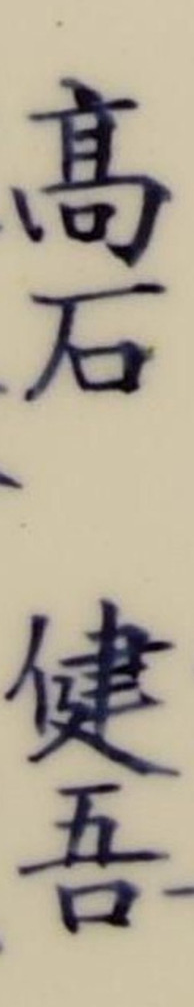高石健吾
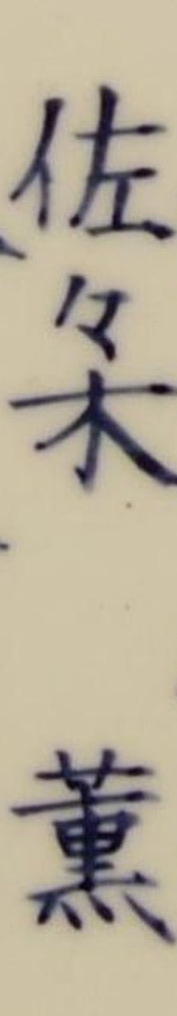佐々木薫
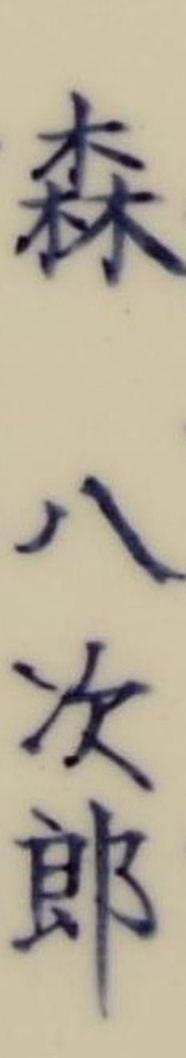森八次郎
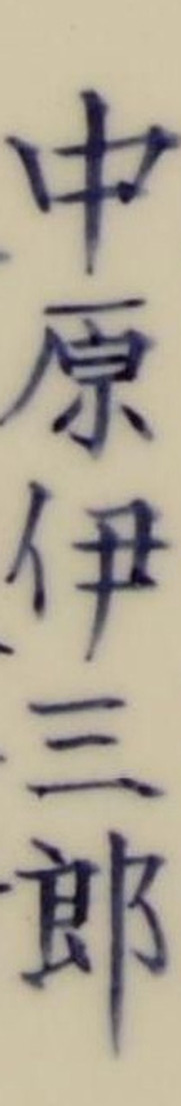中原伊三郎
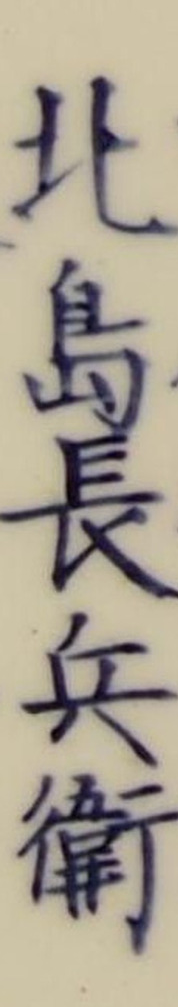北島長兵衛
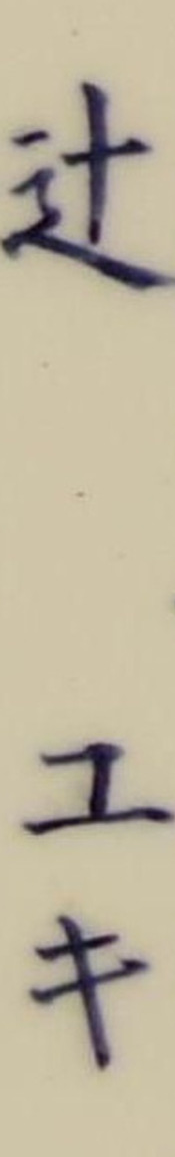辻ユキ
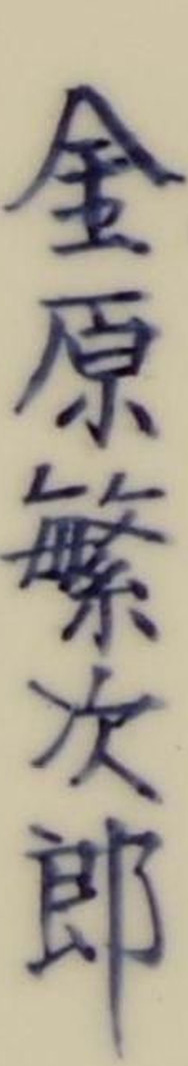金原繁次郎

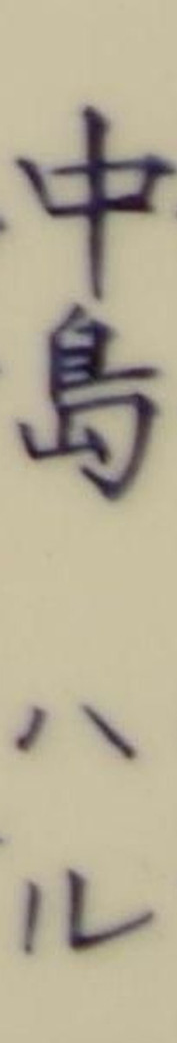中島ハル
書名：E~L
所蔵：高野山金剛峯寺
